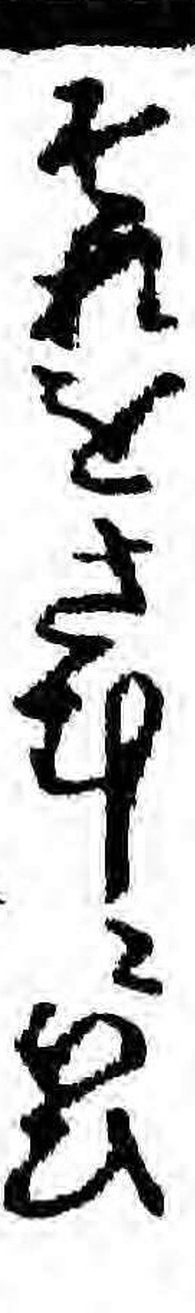それをさむしろにいひ
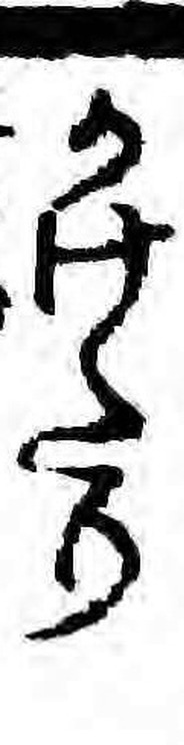かけたり
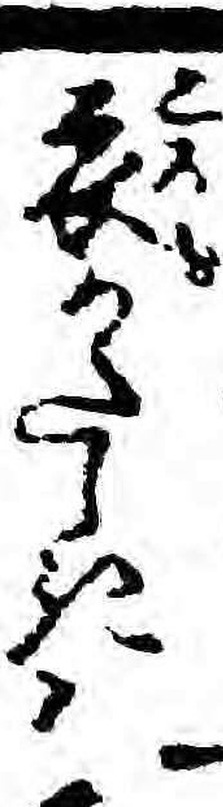衣かたしきは
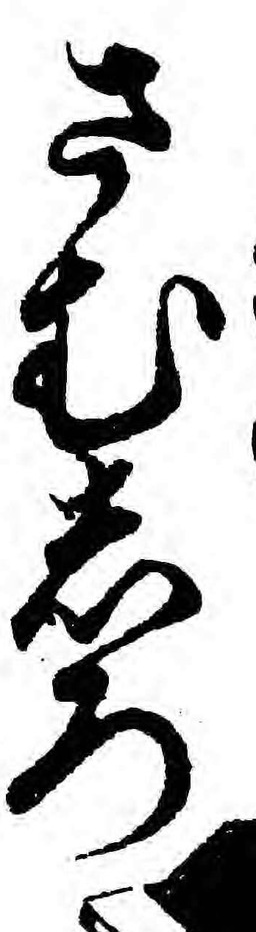さむしろ
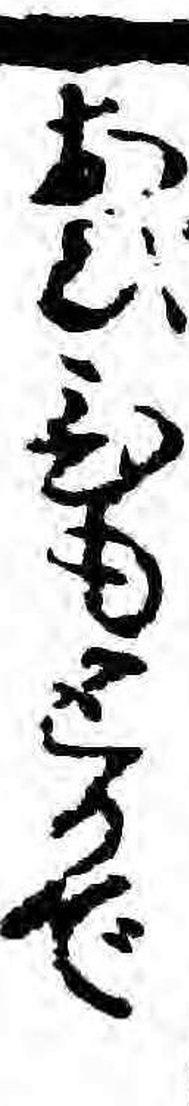おびひもとかで
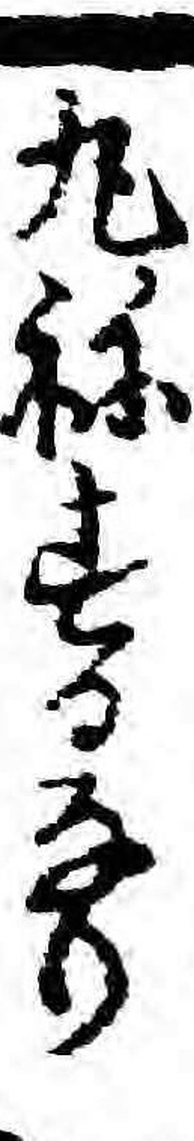丸ねするなり
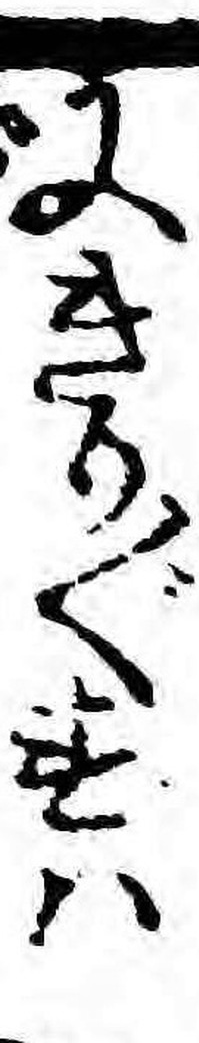またきり〴〵すは
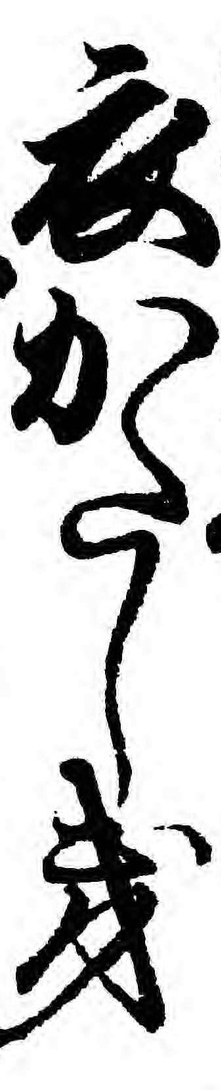衣かたしき
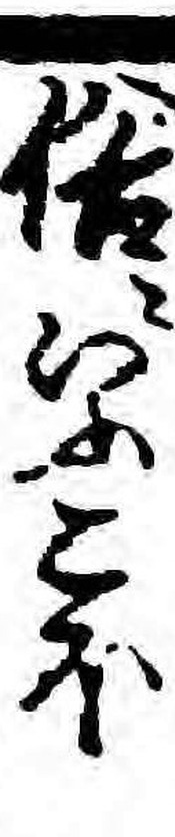俗にいふこほ
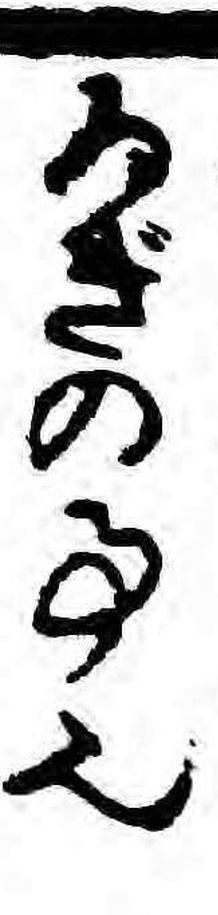ろぎの事也

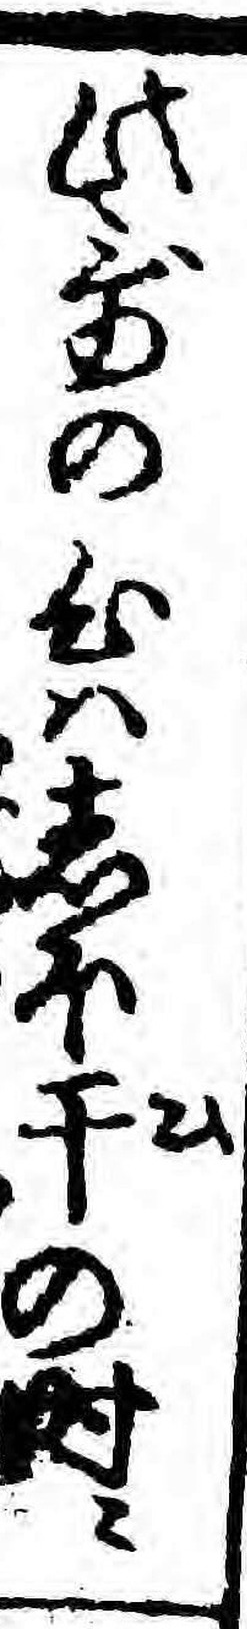此哥の心はしほ干の時に
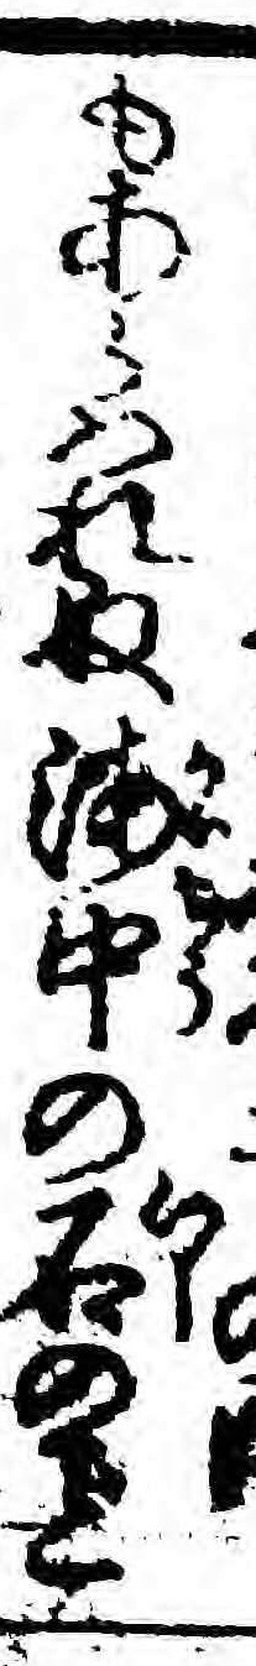もあらはれぬ海中の石のごと
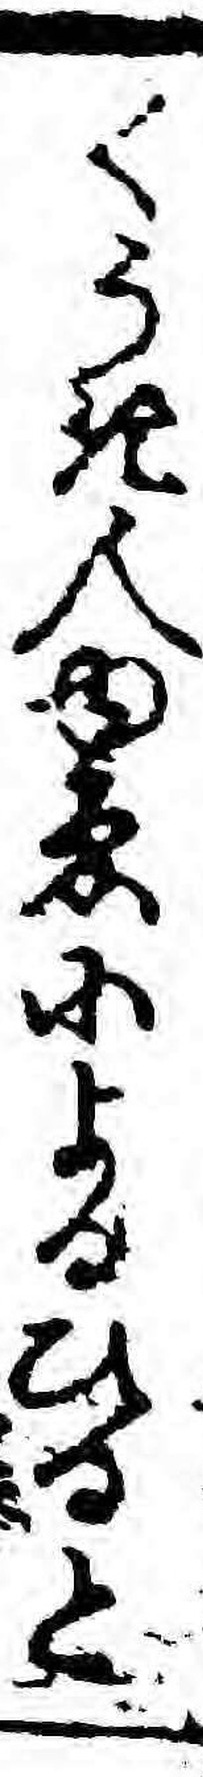くうき人ゆゑによるひると
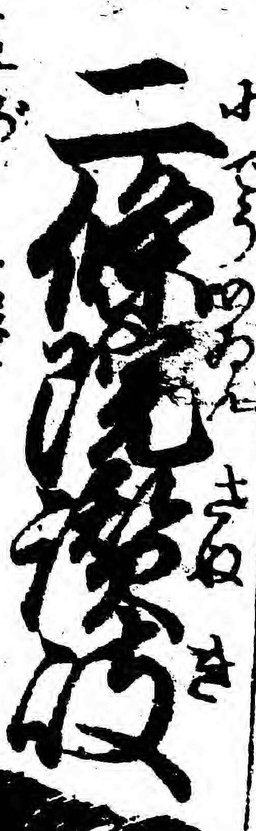二條院讃岐
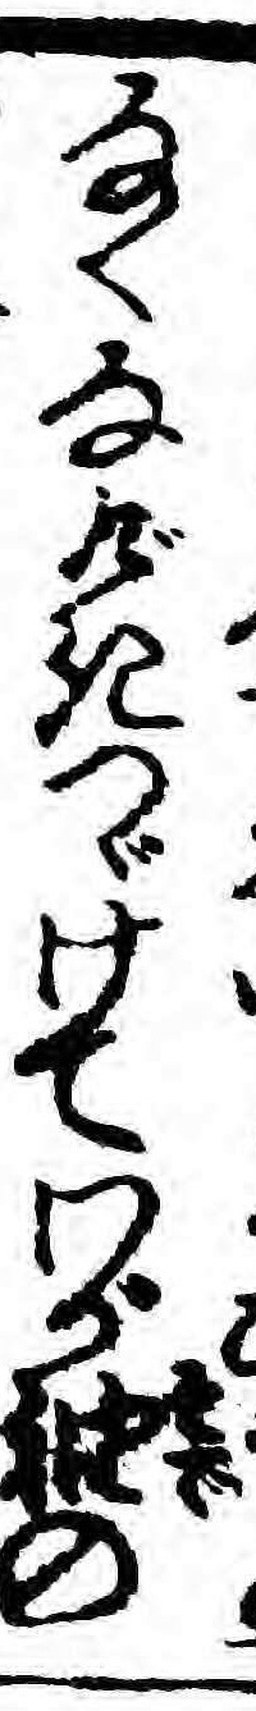なくなげきつゞけてわが袖の
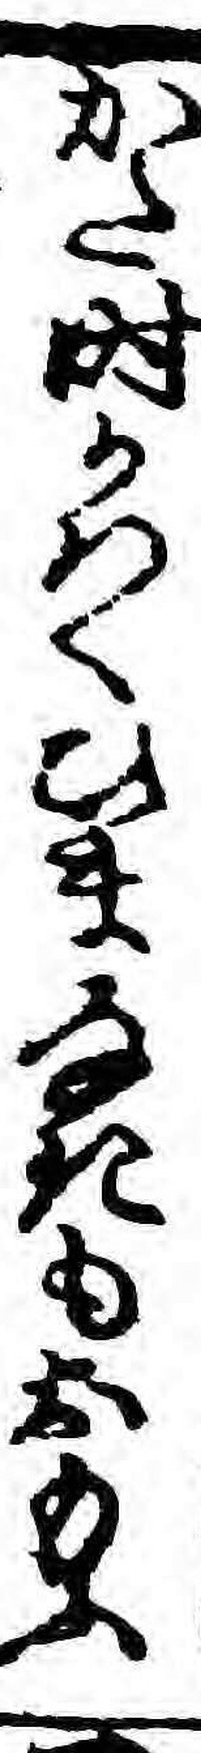かた時かはくひまなきもおもふ
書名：頭書和歌注譯／壽賀多百人一首小倉錦
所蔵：国文学研究資料館
